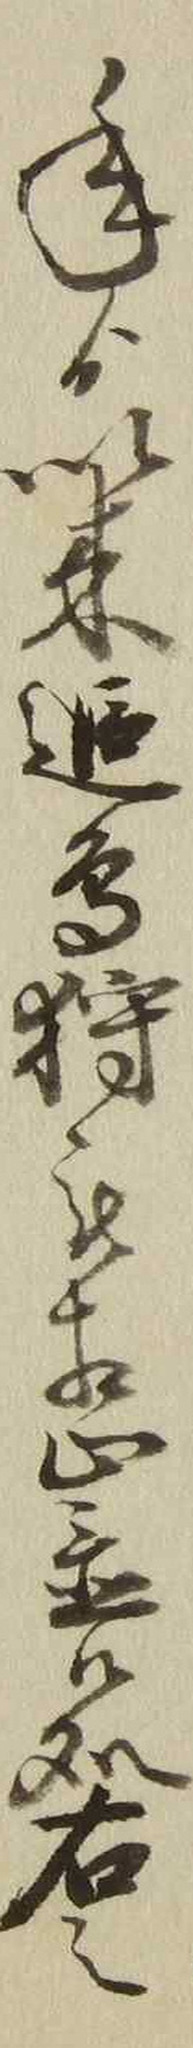年ゟ以来追鳥狩被相止置候処右之
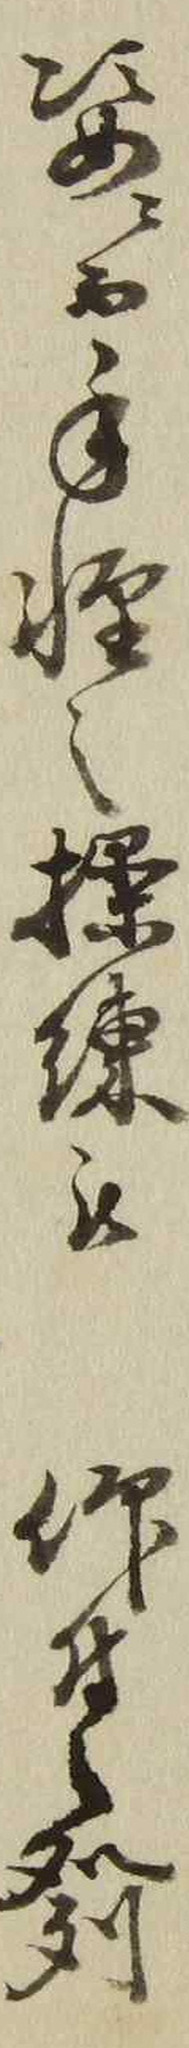姿ニ而手軽之操練被仰付候処列
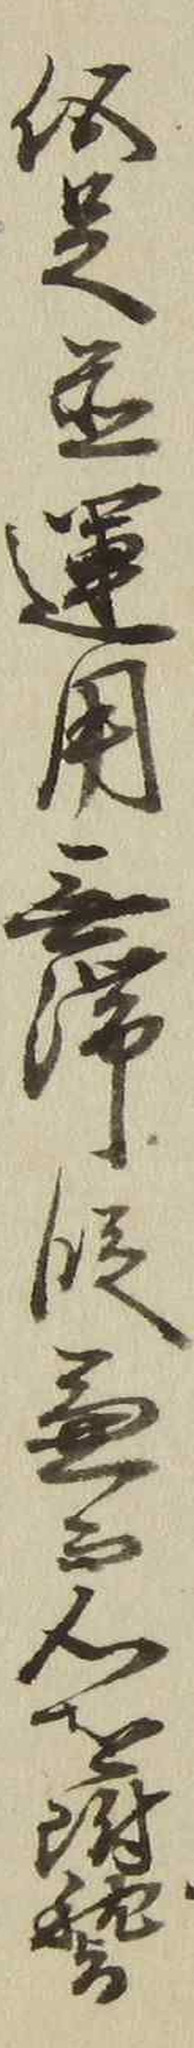伍足並運用無滞段兼而心を附稽
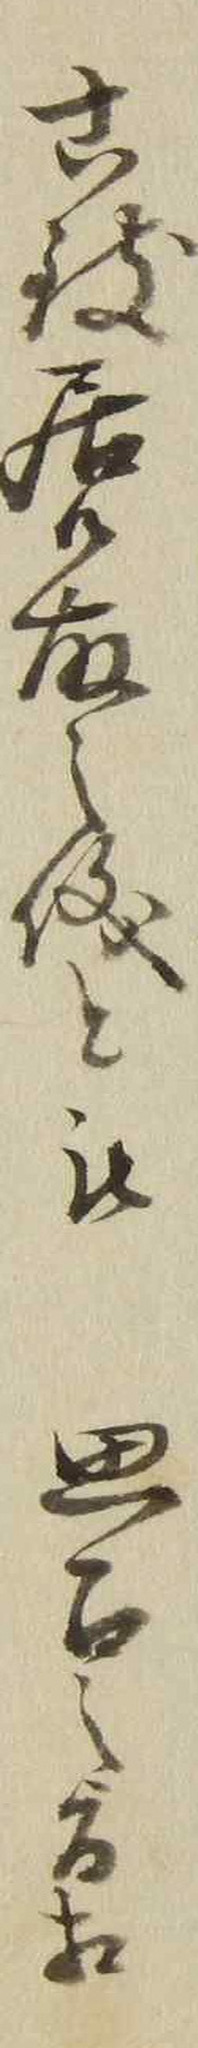古致居候故之儀と被思召之旨相
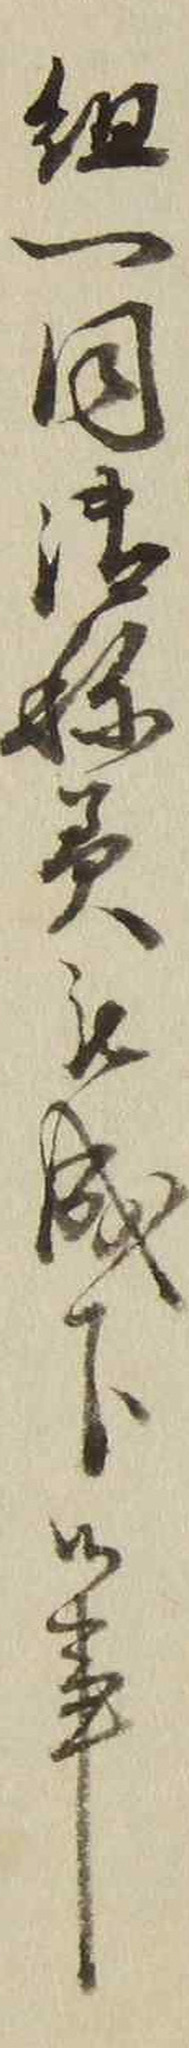組一同御称美被成下候事

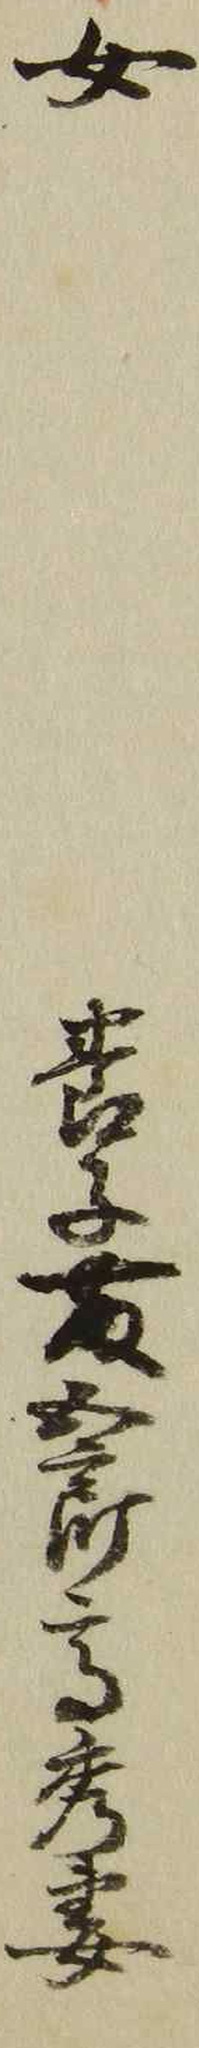女養子藤五郎高秀妻
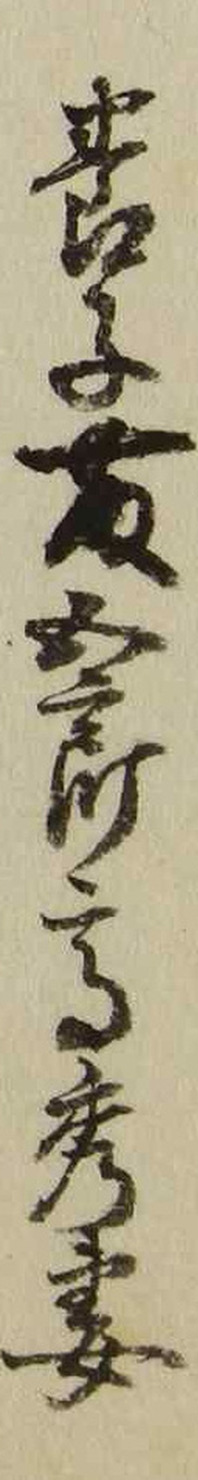女養子藤五郎高秀妻
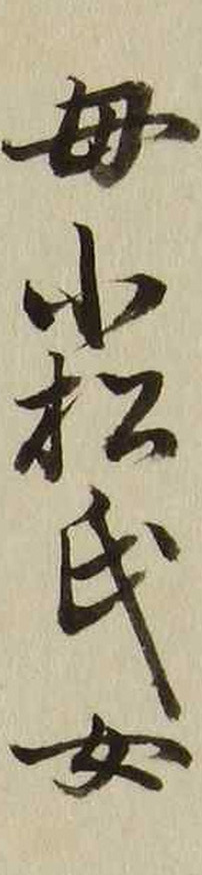母小松氏女
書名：諸士系譜　巻之31　い之部31
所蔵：会津若松市立会津図書館
